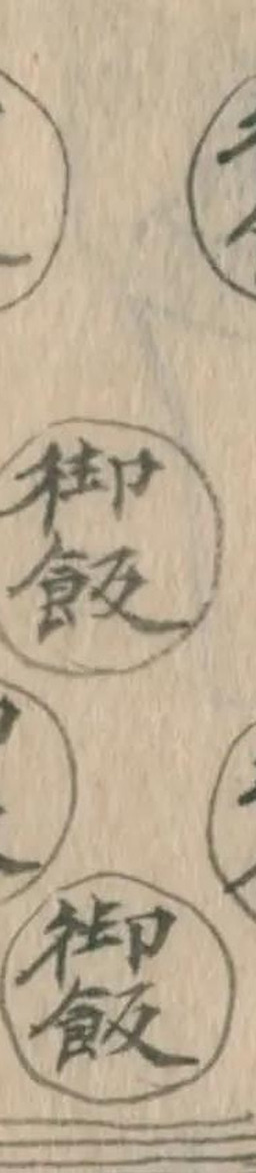御飯御飯御箸
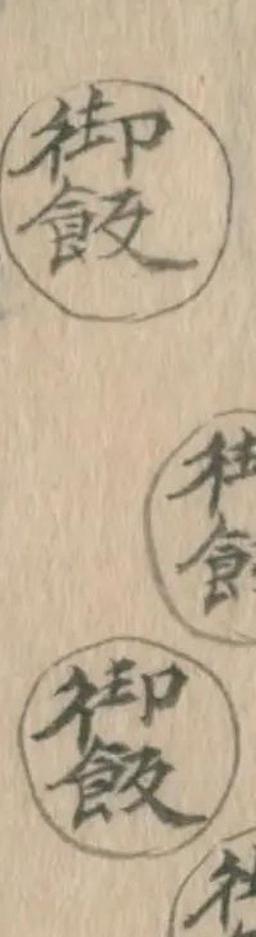御飯御飯
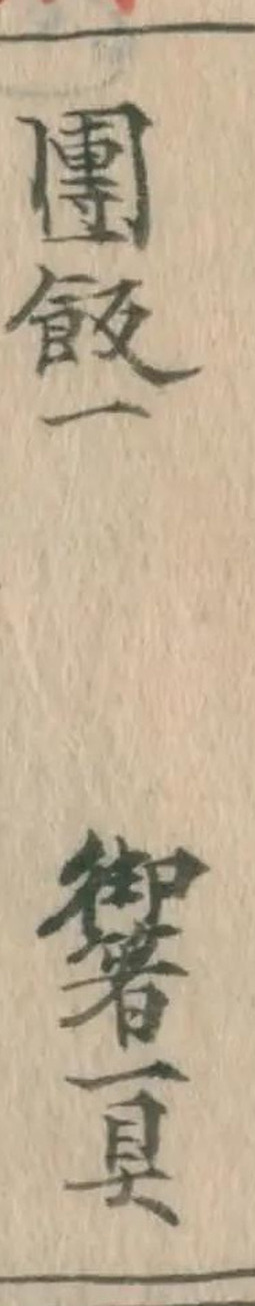団飯一御箸一具
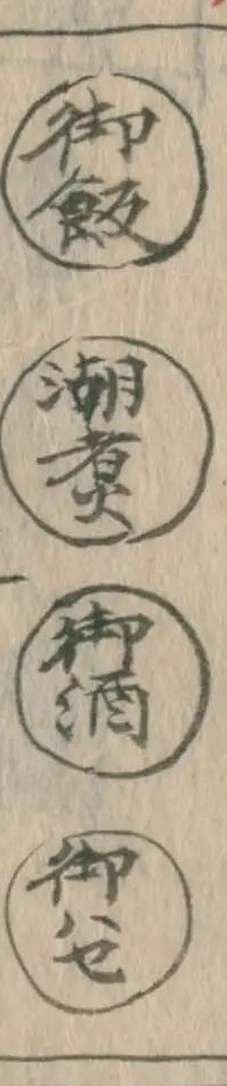御飯湖煮御酒御ハセ
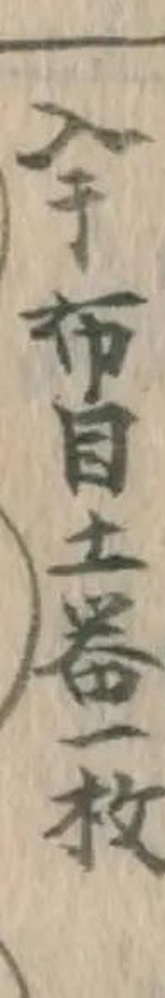入于布目土器一枚
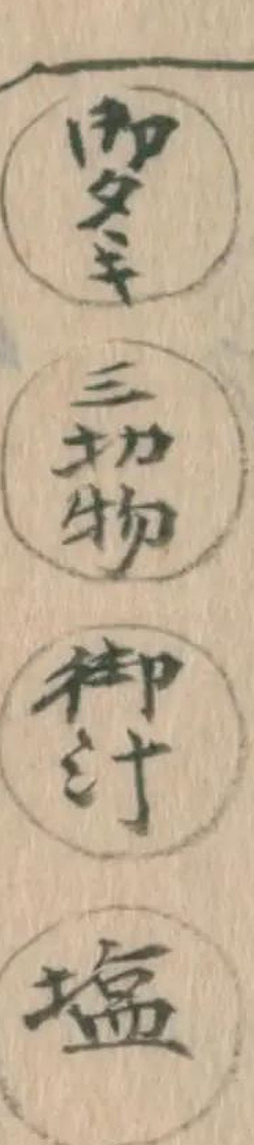御タヽキ三切物御汁塩
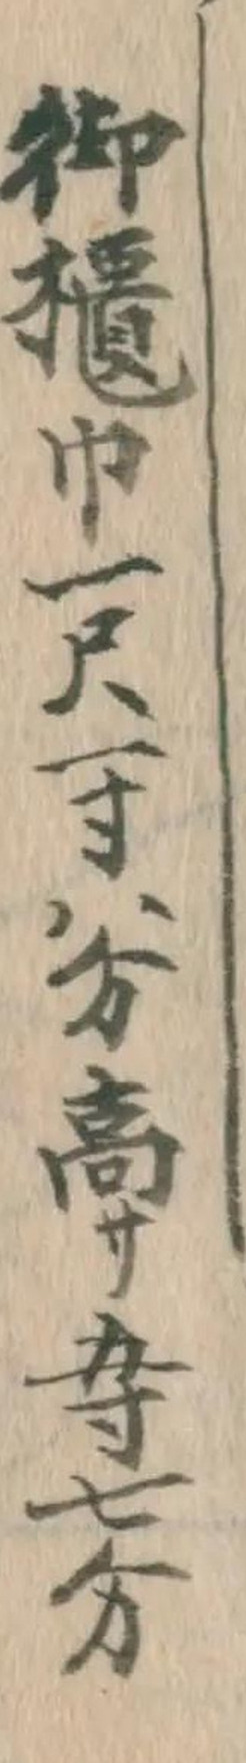御櫃巾一尺一寸八分高サ五寸七分
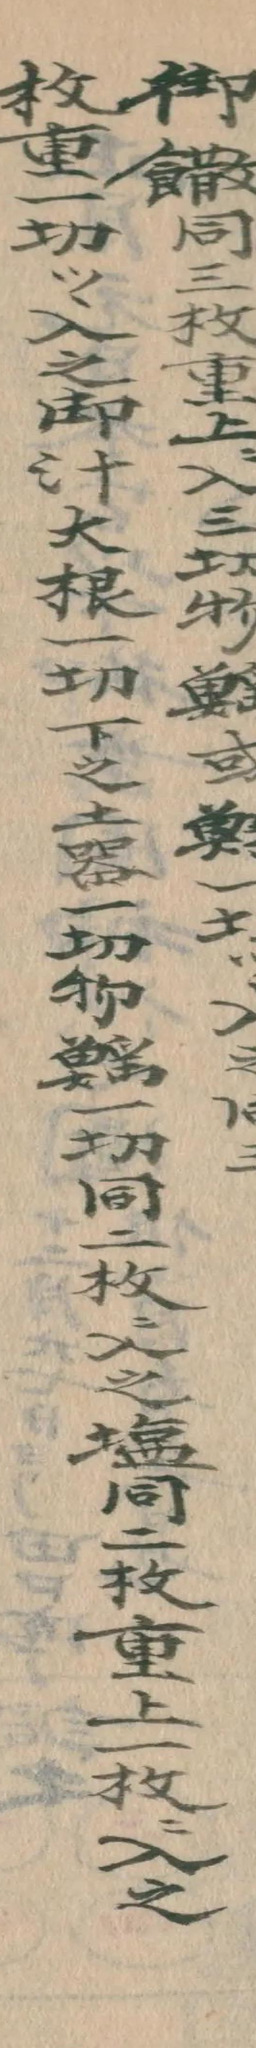枚重一切ツヽ入之御汁大根一切下之土器一切物鰩一切同二枚ニ入之塩同二枚重上一枚ニ入之
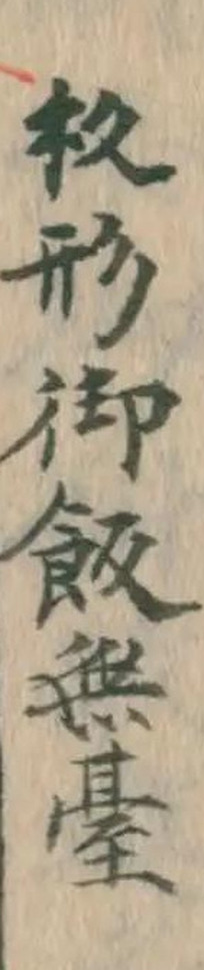(杉形御飯無台
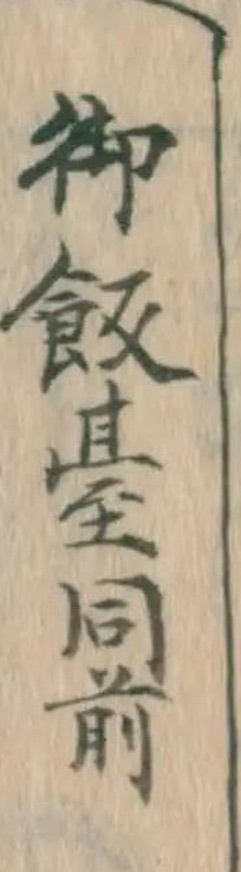御飯台同前
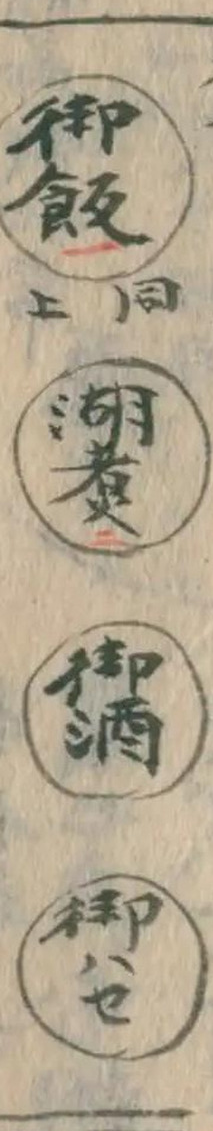御飯湖煮御酒御ハセ

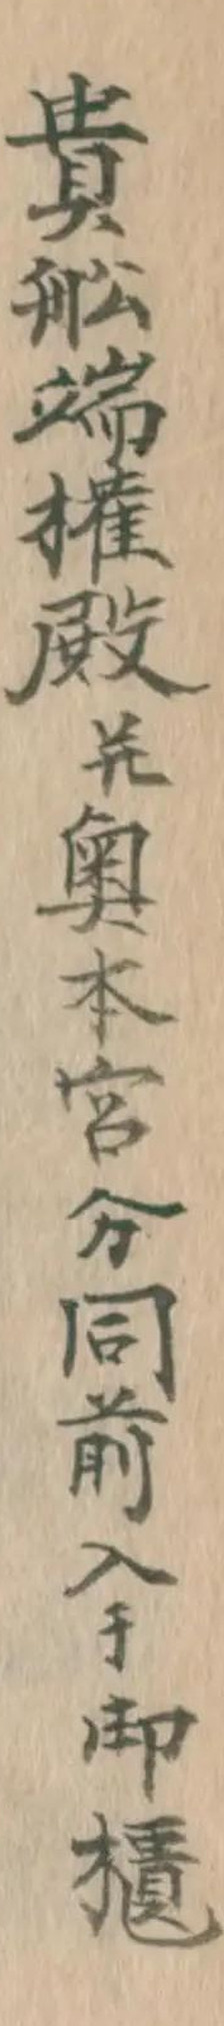貴船端権殿并奥本宮分同前入于御櫃
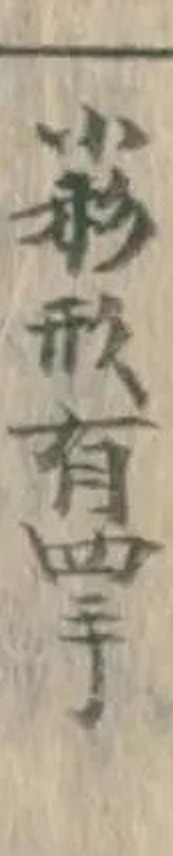小杉形有四手
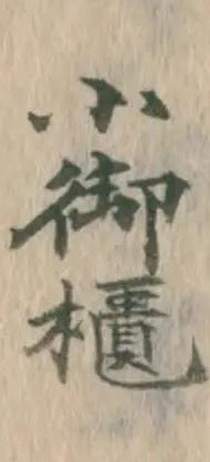小御櫃
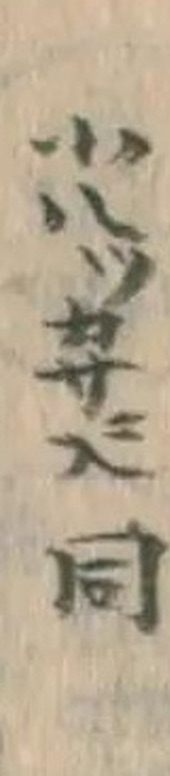小八ツカサニ入同
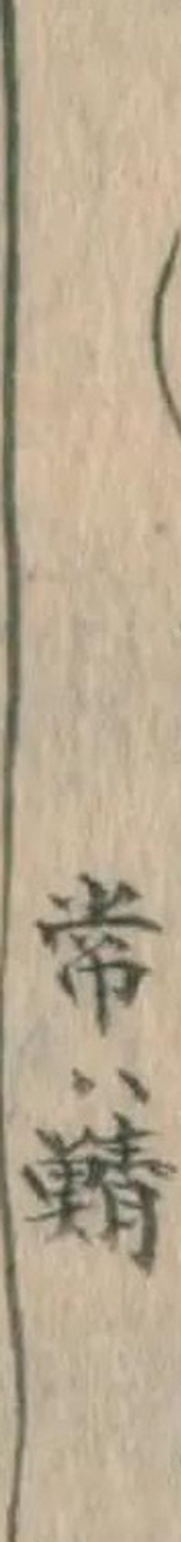常ハ鯖
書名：賀茂社記録. 第9冊
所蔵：国立国会図書館 National Diet Library, JAPAN
